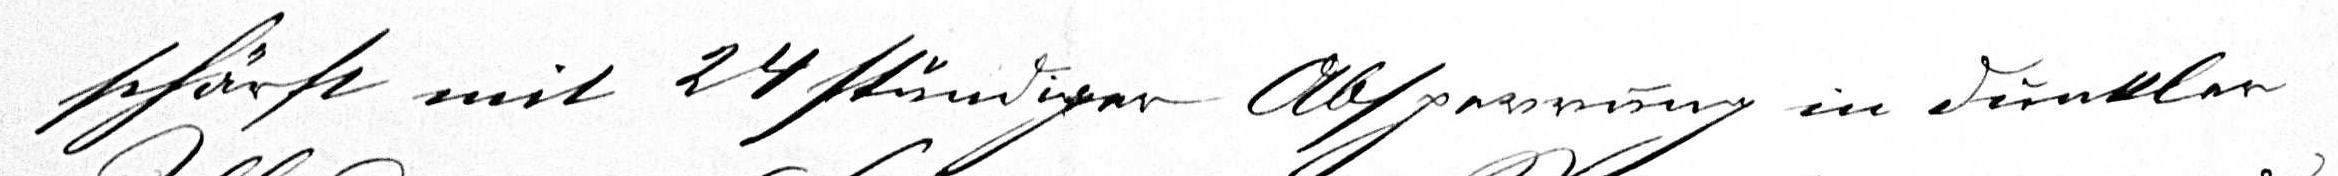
schärft mit 24 stündiger Absperrung in dunkler
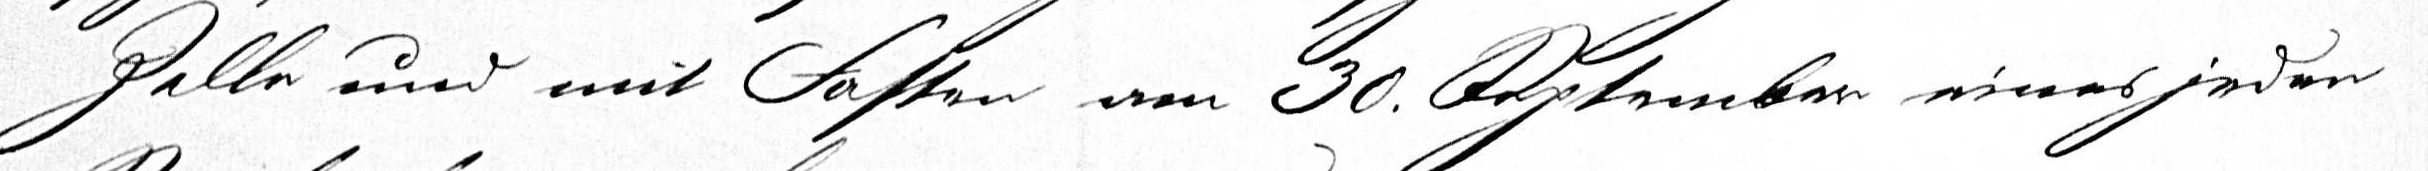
Zelle und mit Fasten am 30. September eines jeden
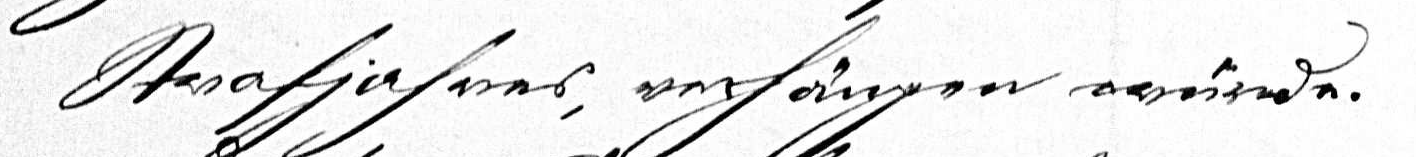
Strafjahres, verhängen würde.
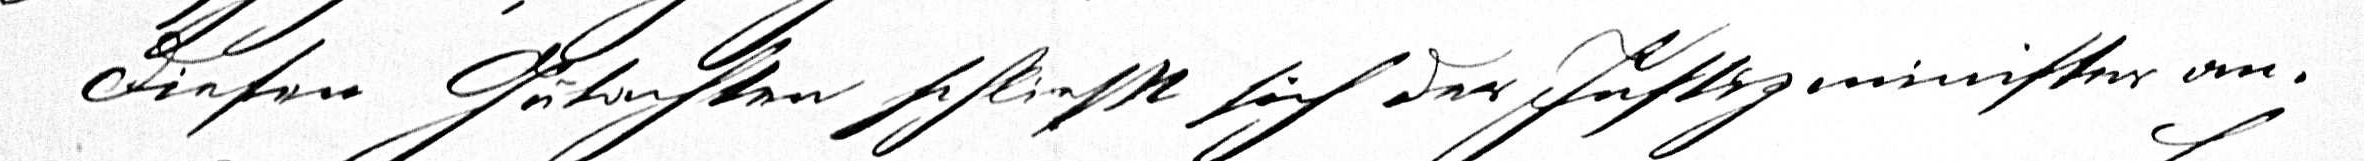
Diesen Gutachten schließt sich der Justizminister an.
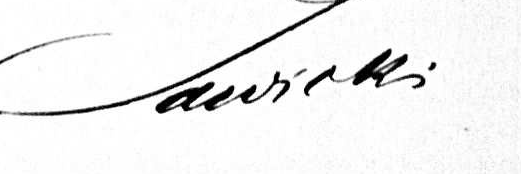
Sawicki
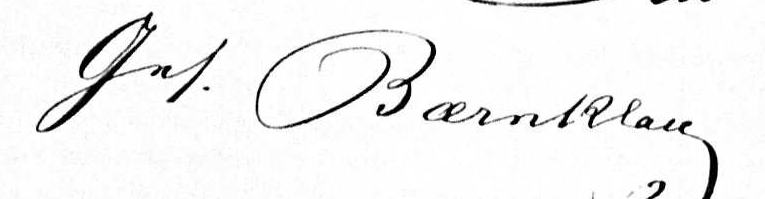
Ges. Baernklau
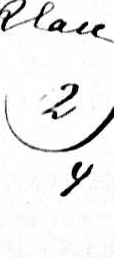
2/4
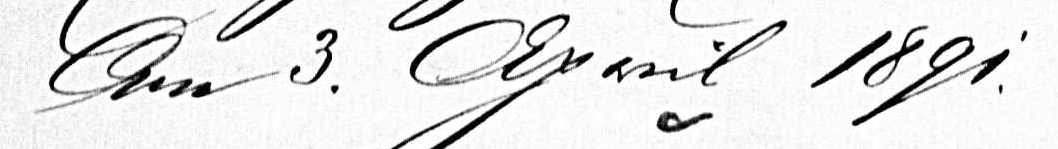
Am 3. April 1891
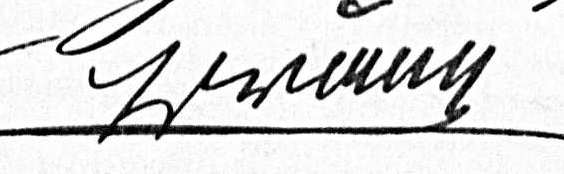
Wraany
